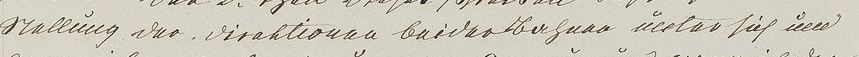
Stellung der Direktionen beider Bahnen unter sich und
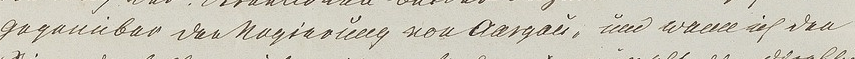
gegenüber der Regierung von Aargau, und wenn ich den
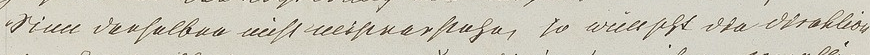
Sinn derselben nicht missverstehe, so wünscht die Direktion
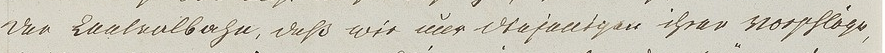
der Centralbahn, daß wir nur diejenigen ihrer Vorschläge,
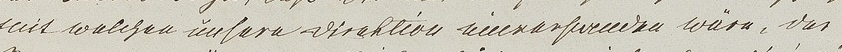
mit welchen unsere Direktion einverstanden wäre, der
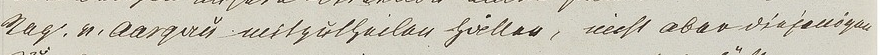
Reg. v. Aargau mitzutheilen hätten, nicht aber diejenigen
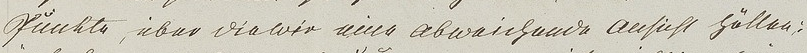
Punkte, über die wir eine abweichende Ansicht hätten;
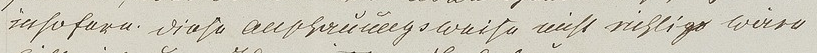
insofern diese Anschauungsweise nicht richtig wäre
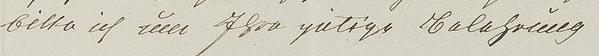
bitte ich um Ihre gütige Belehrung.
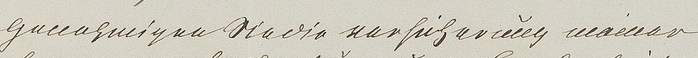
Genehmigen Sie die Versicherung meiner
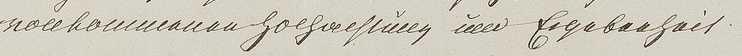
vollkommenen Hochachtung und Ergebenheit
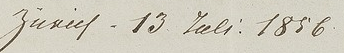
Zürich – 13 Juli. 1856
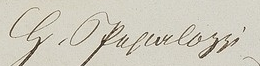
H. Pestalozzi
